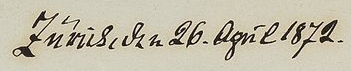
Zürich, den 26. April 1872.
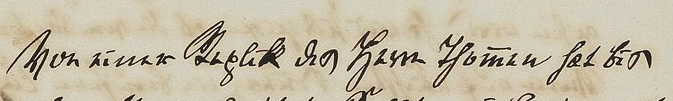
Von einer Replik des Herrn Thommen hat bis
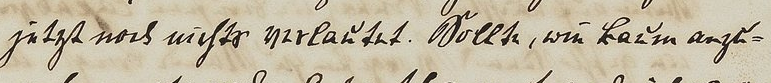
jetzt noch nichts verlautet. Sollte, wie kaum anzu-
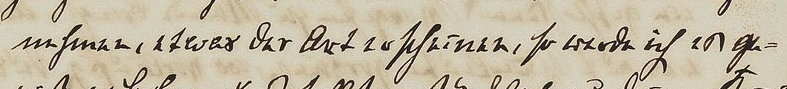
nehmen, etwas der Art erscheinen, so werde ich es ge-
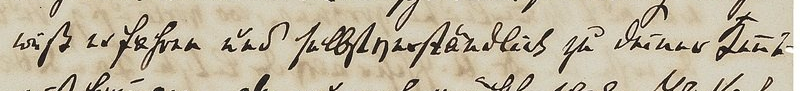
wiß erfahren und selbstverständlich zu deiner Kennt-
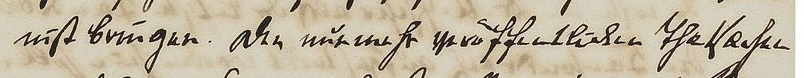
niß bringen. Den nunmehr veröffentlichen Thatsachen
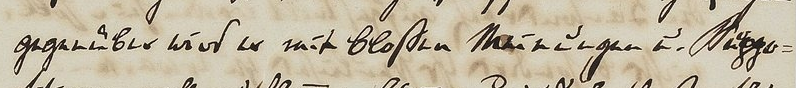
gegenüber wird er mit bloßen Meinungen u. Suppo-
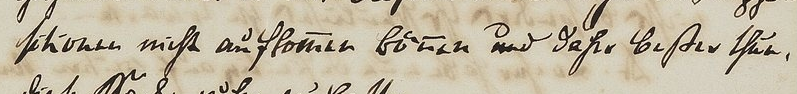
sitionen nicht aufkommen können und daher beßer thun,
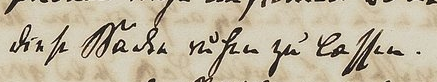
diese Sache ruhen zu lassen.
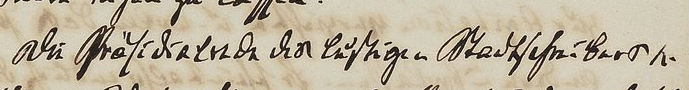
Die Präsidialrede des lustigen Stadtschreibers v.
